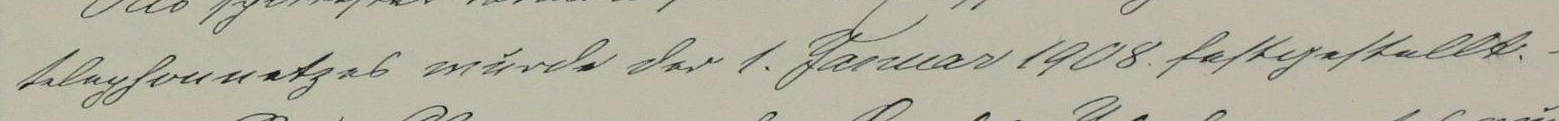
telephonnetzes wurde der 1. Januar 1908 festgestellt.
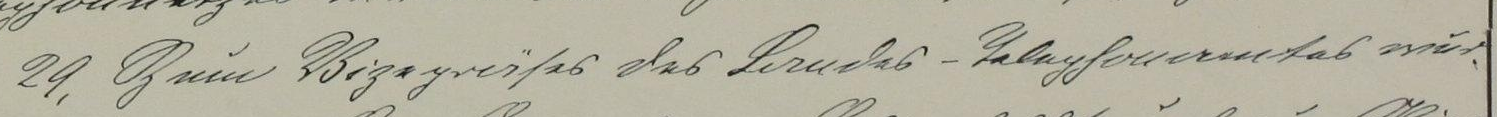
29. Zum Vizepräses des Landes-Telephonamtes wur-
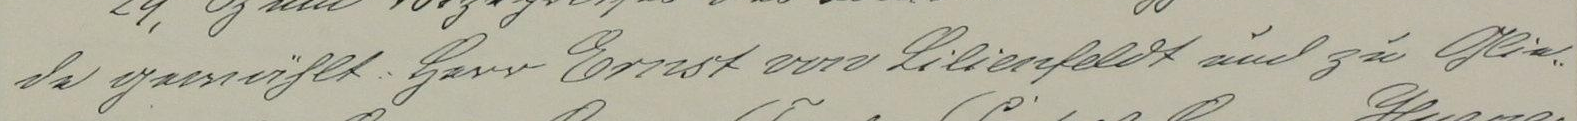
de gewählt: Herr Ernst von Lilienfeldt und zu Glie-
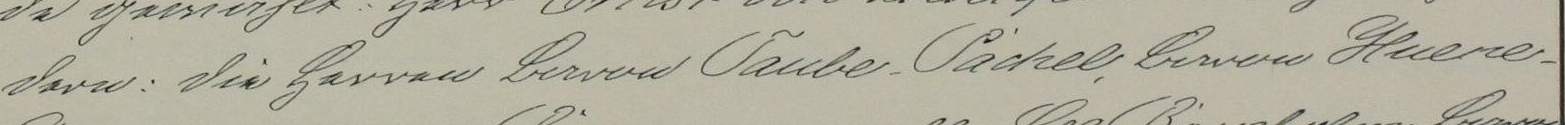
dern: die Herren Baron Taube-Pachel, Baron Huene-
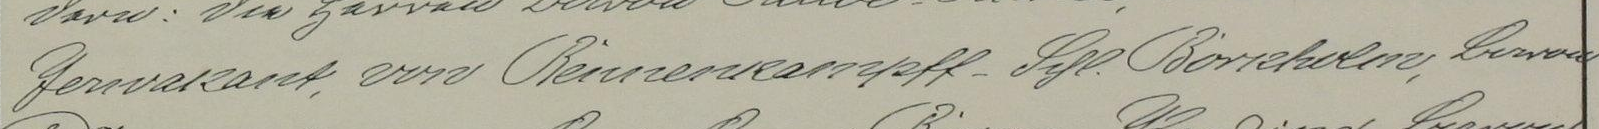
Jerwakant, von Rennenkampff-Schl. Borkholm, Baron
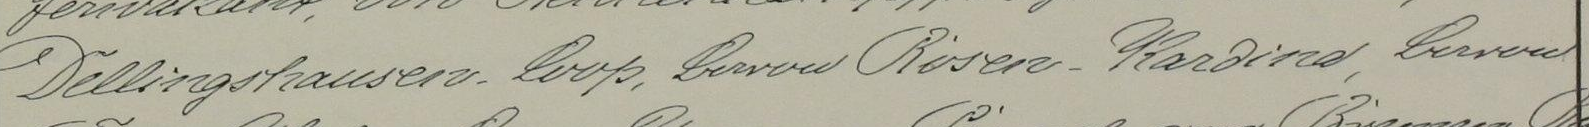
Dellingshausen-Loop, Baron Rosen-Kardina, Baron
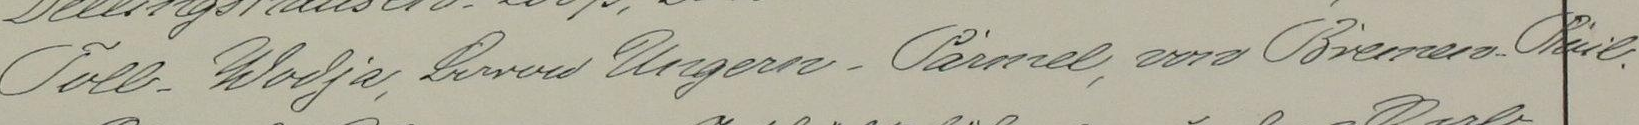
Toll-Wodja, Baron Ungern-Parmel, von Bremen-Ruil.
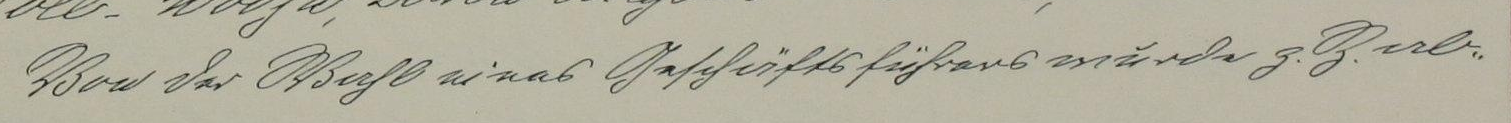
Von der Wahl eines Geschäftsführers wurde z.Z. ab-
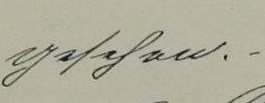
gesehen.
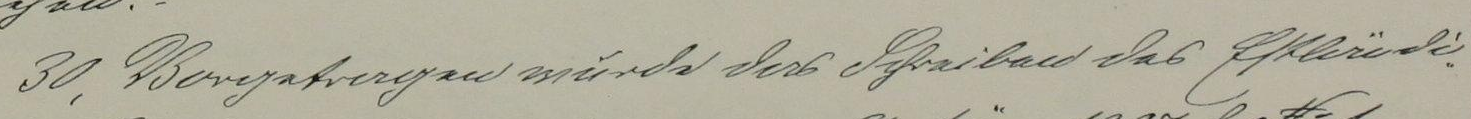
30. Vorgetragen wurde das Schreiben des Estländi-
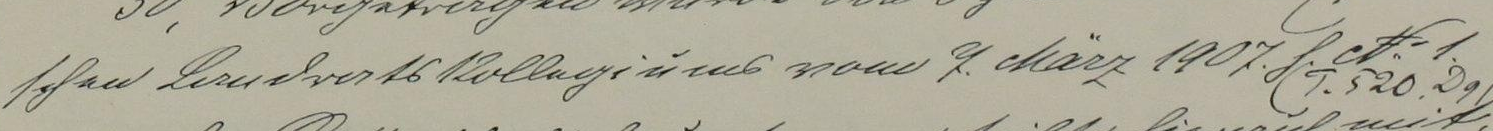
schen Landratskollegiums vom 7. März 1907. s. No.1
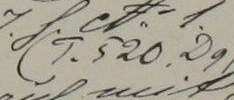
(T.520. D9)
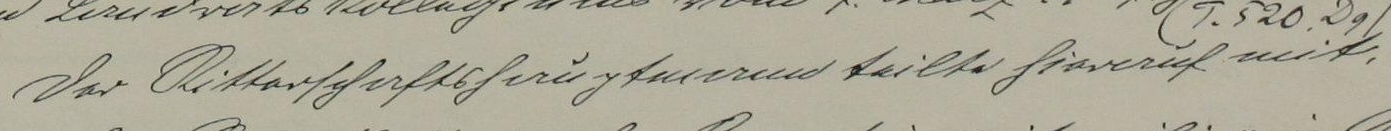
Der Ritterschaftshauptmann teilte hierauf mit,
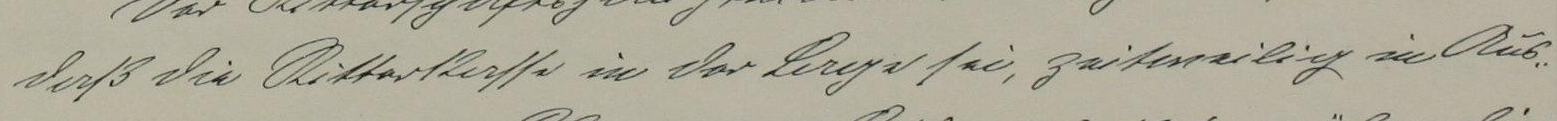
daß die Ritterkasse in der Lage sei, zeitweilig in Aus-
